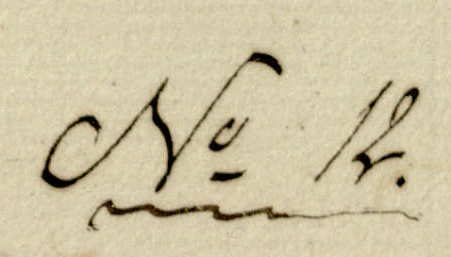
No 12.
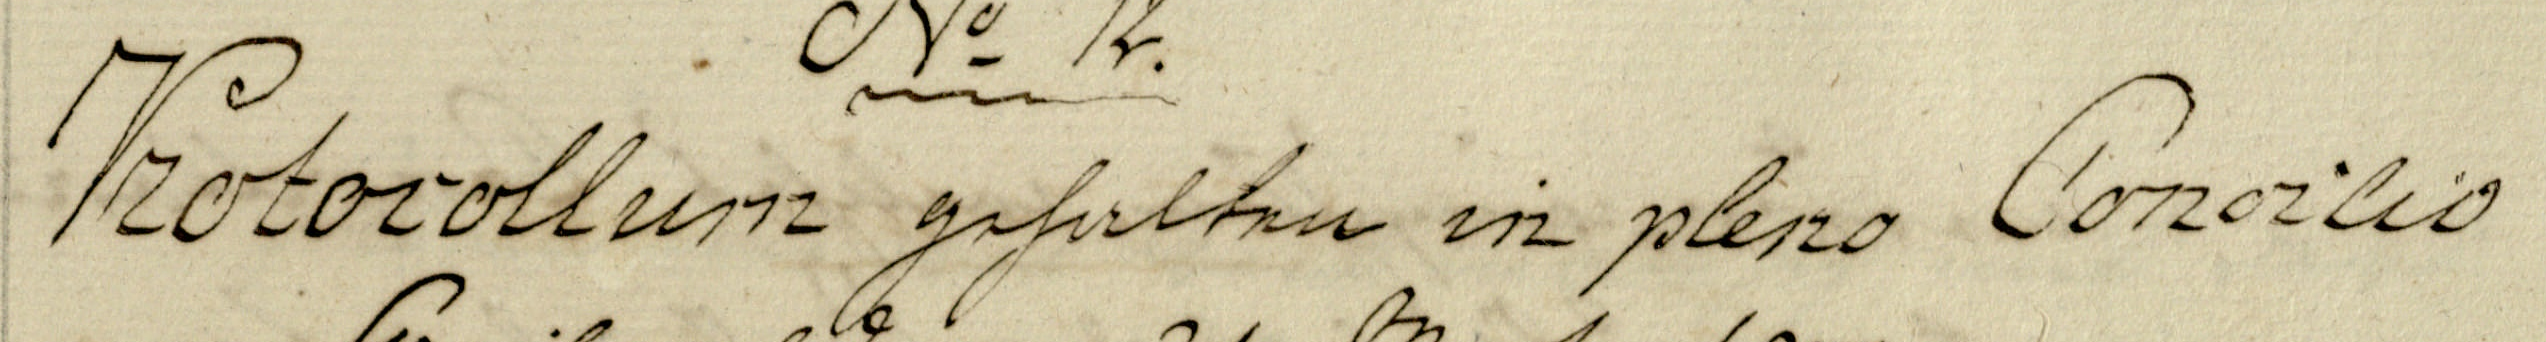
Protocollum gehalten in pleno Concilio
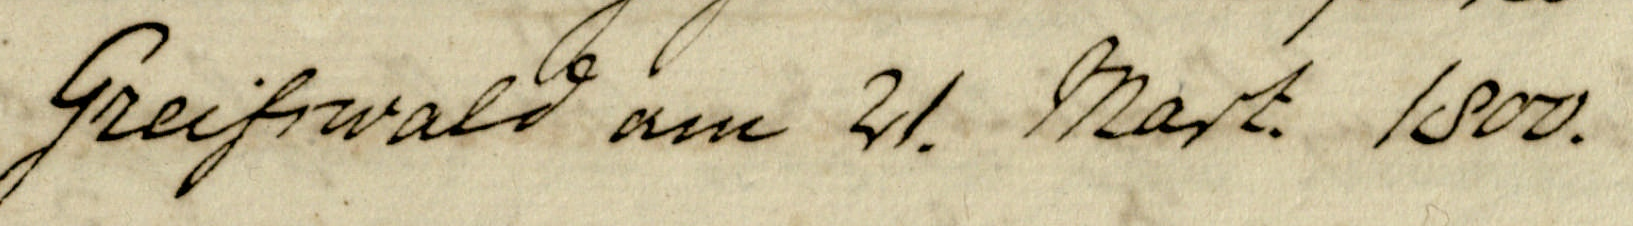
Greifswald am 21. Mart. 1800.
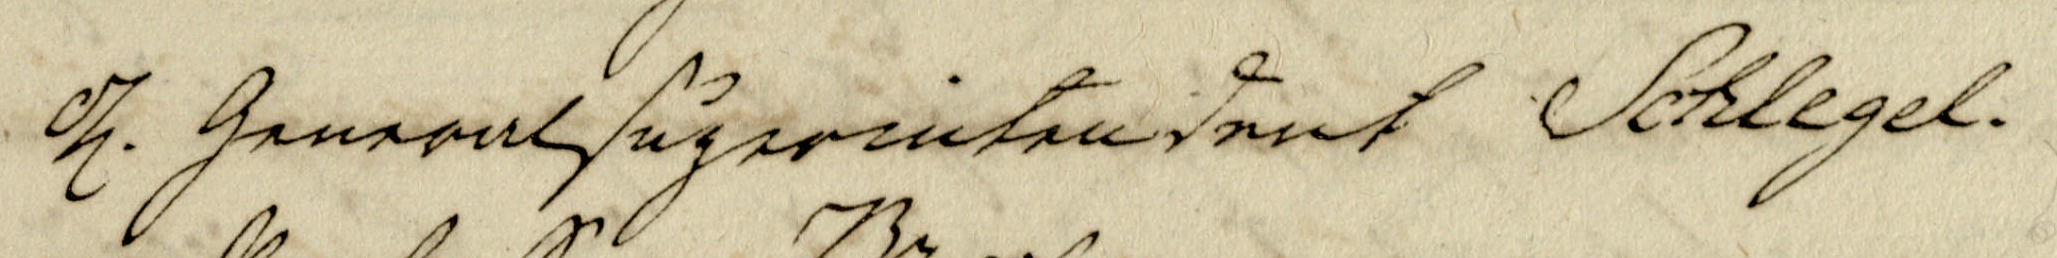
dh. Generalsuperintendent Schlegel.
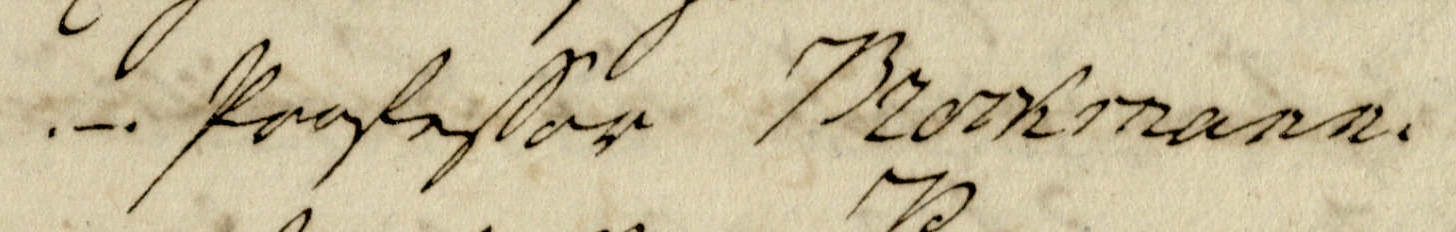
Professor Brockmann.
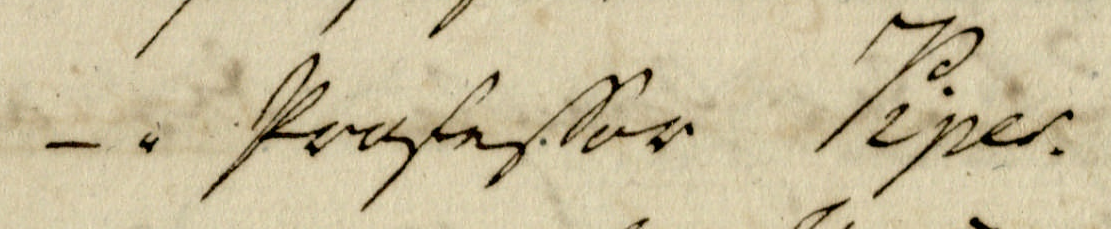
Professor Piper.
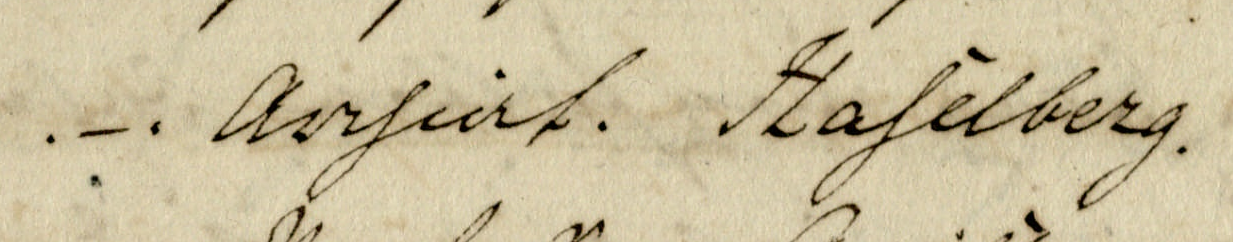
Archiat. Haselberg.
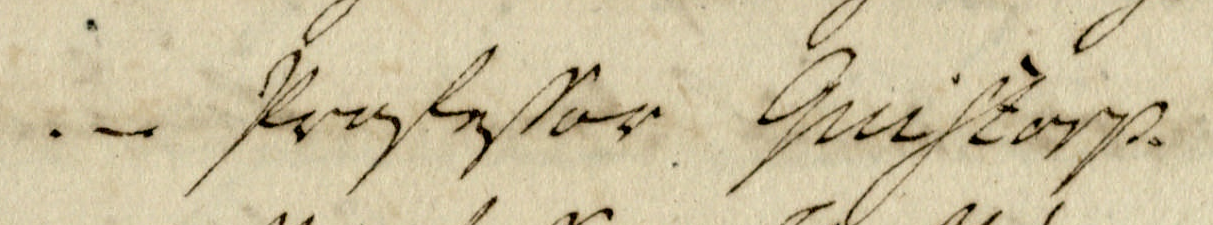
Professor Quistorp.
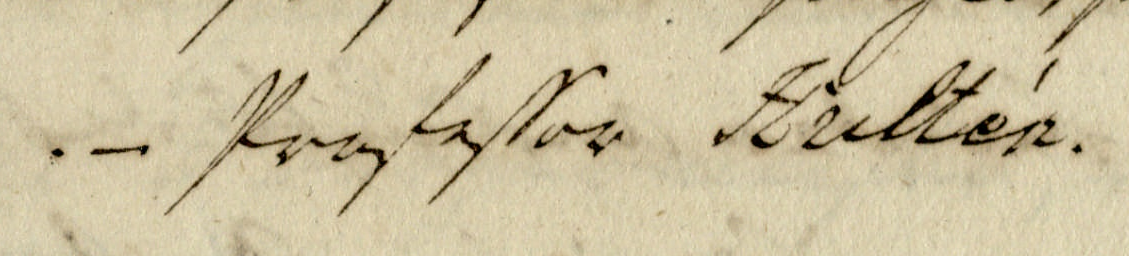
Professor Hultén.
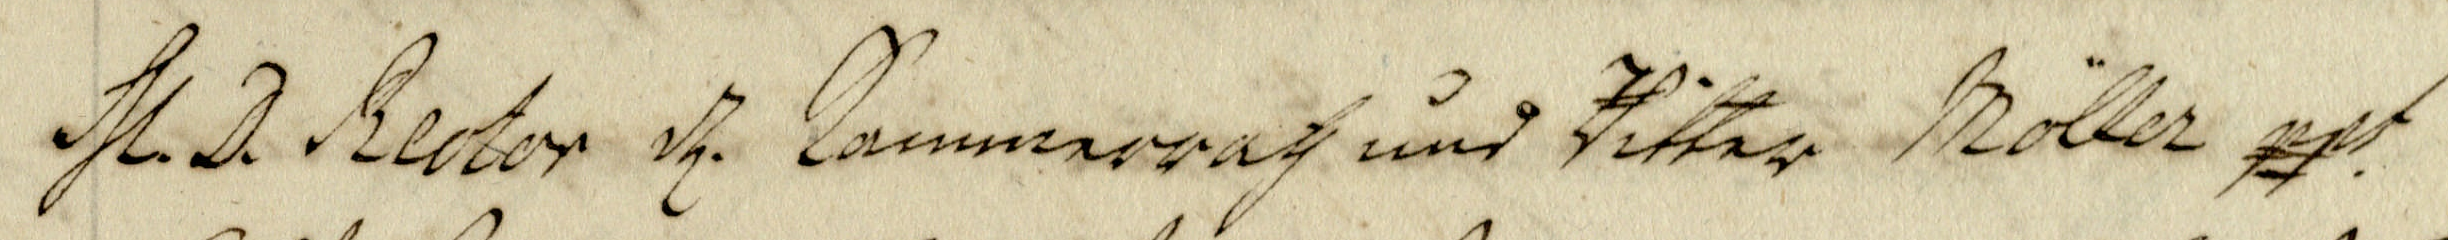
M. D. Rector dh. Kammerrath und Ritter Möller ppt
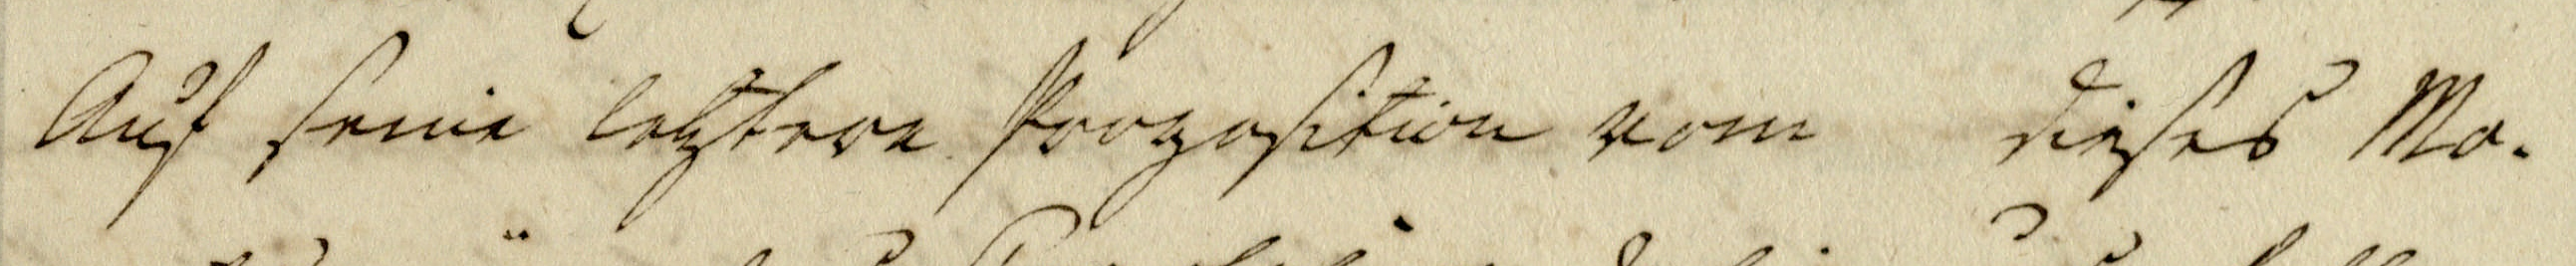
Auf seine letztere Proposition vom dieses Mo¬
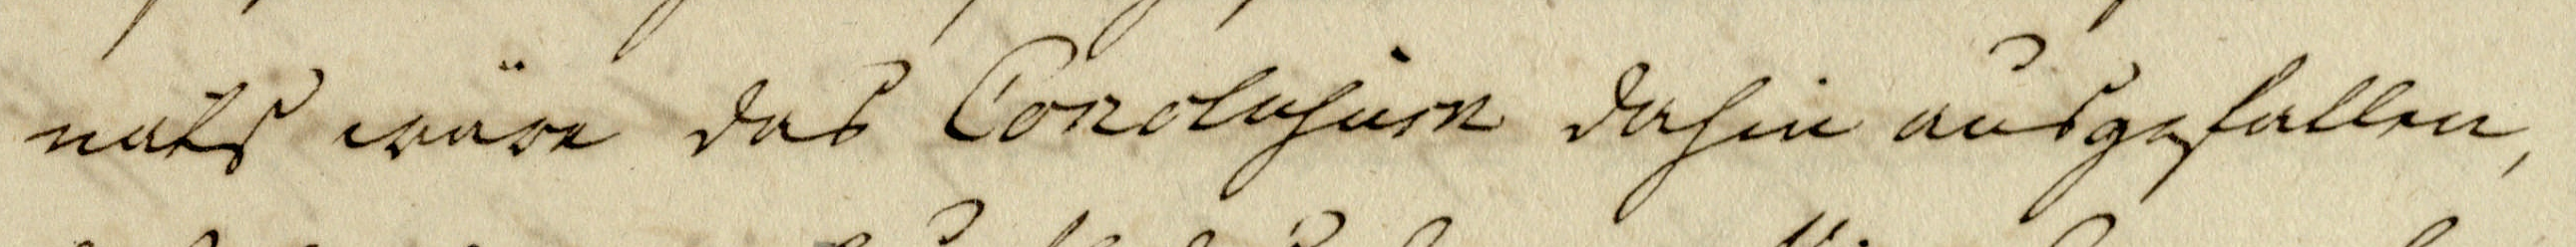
nats wäre das Conclusum dahin ausgefallen,
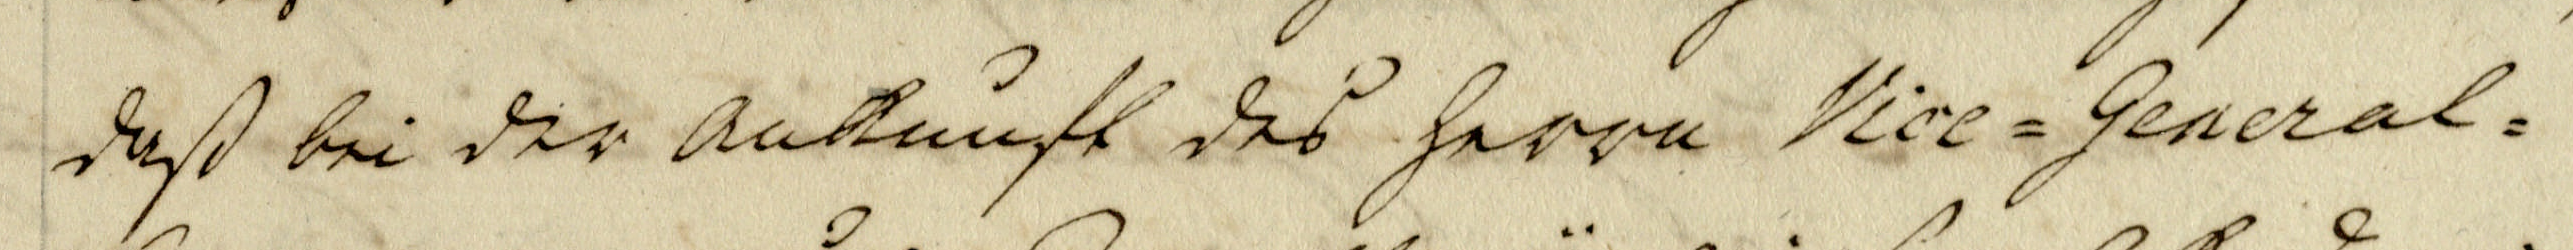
daß bei der Ankunft des Herrn Vice-General¬
